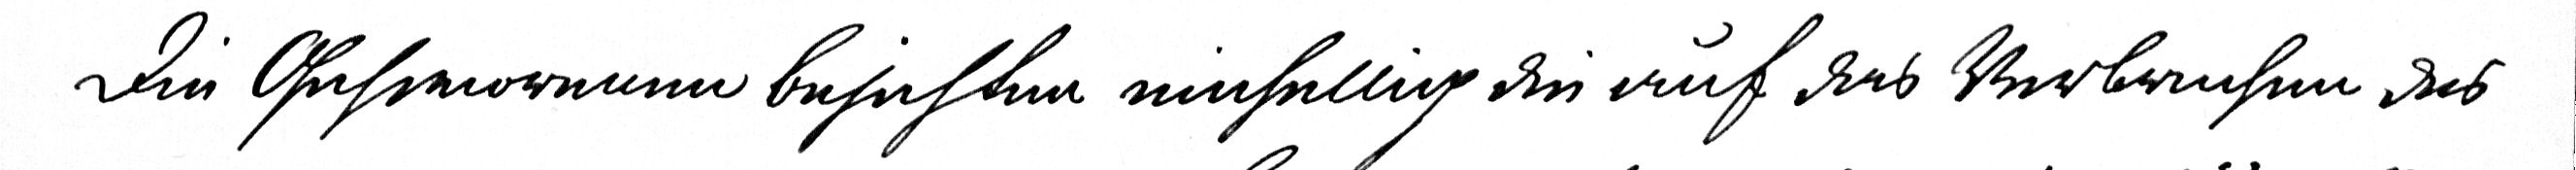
Die Gessemrenen bejahten einhellig die auf das Verbrehen des
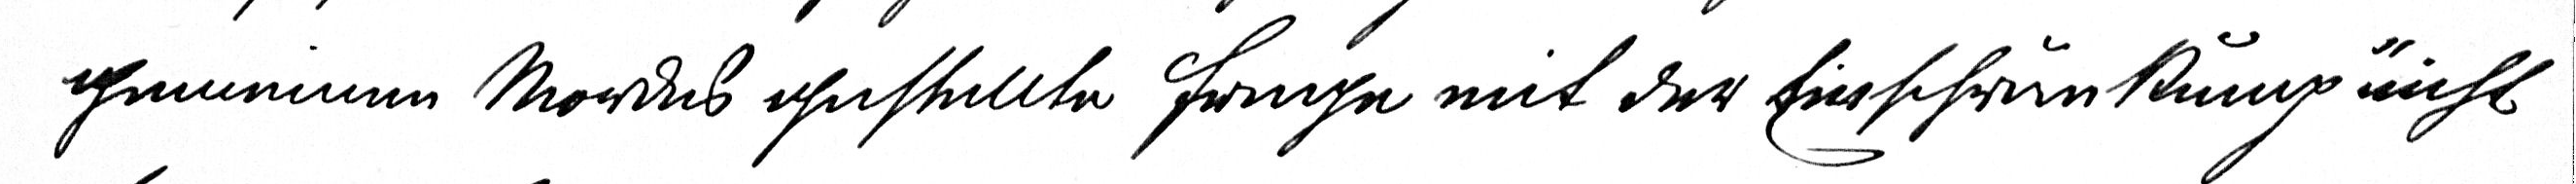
gemeinen Mordes gestellte Frage mit der Einschränkung "nicht
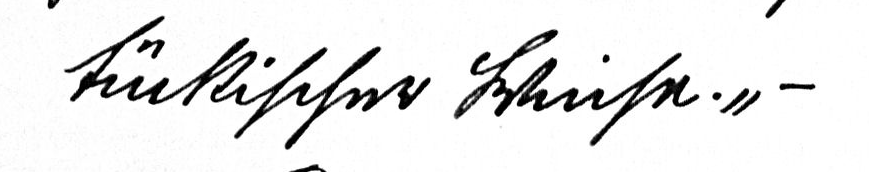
tückischer Weise." -
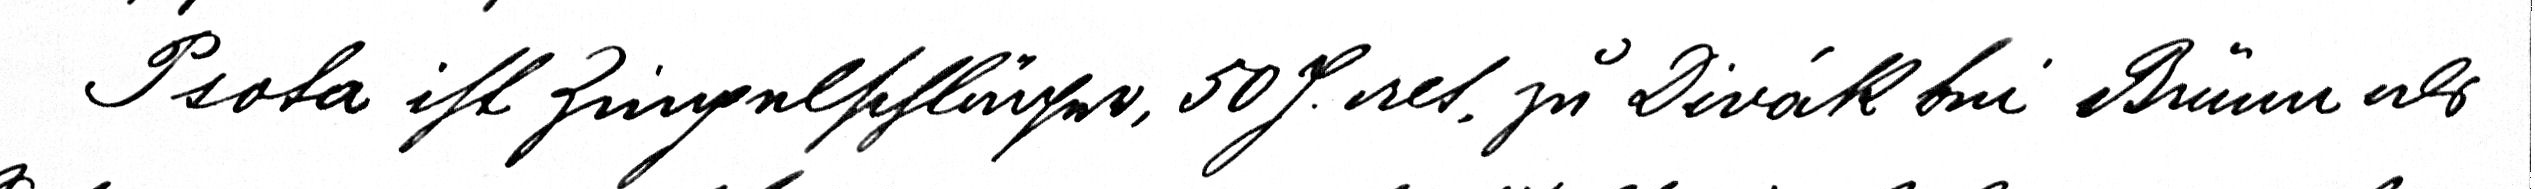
Psota ist Ziegelschläger, 50 J. als. zu Divák bei Brünn als
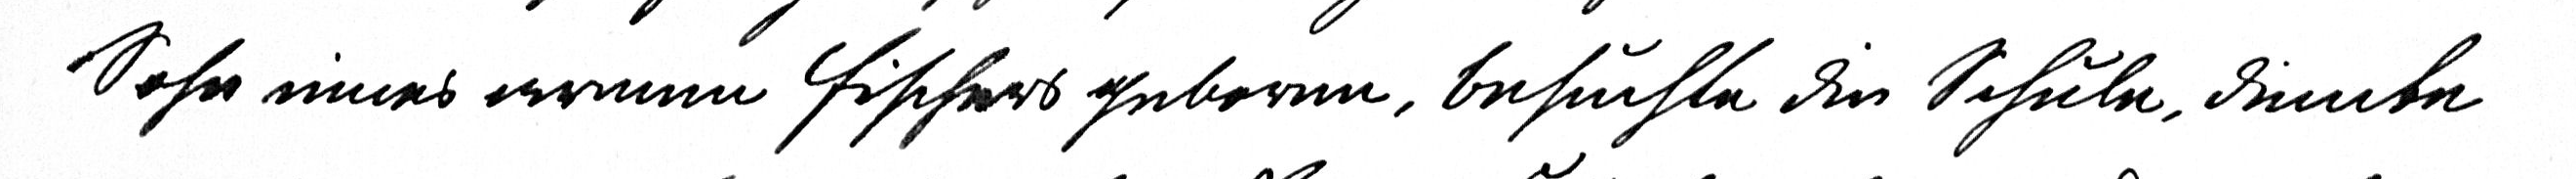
Sohn eines armen Fischers geboren, besuchte die Schule, diente
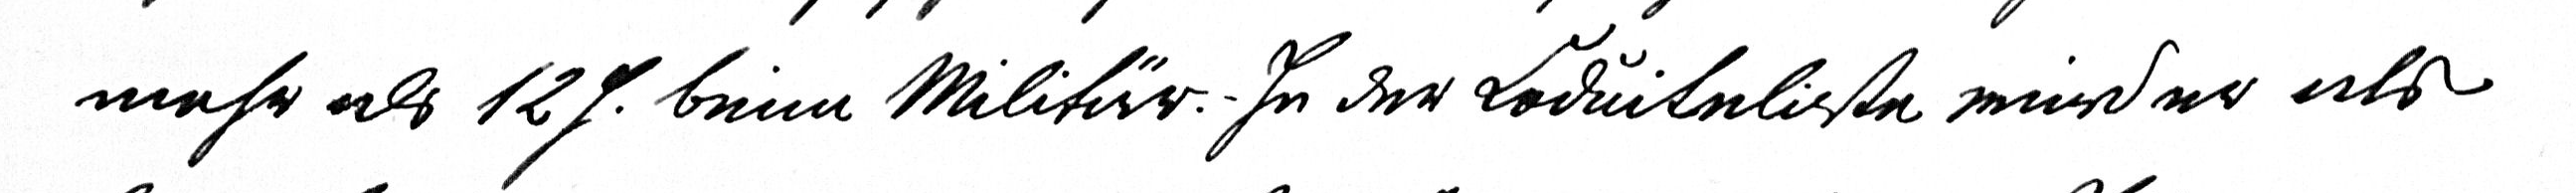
mehr als 12 J. beim Militär. - In der Coduiteliste mied er als
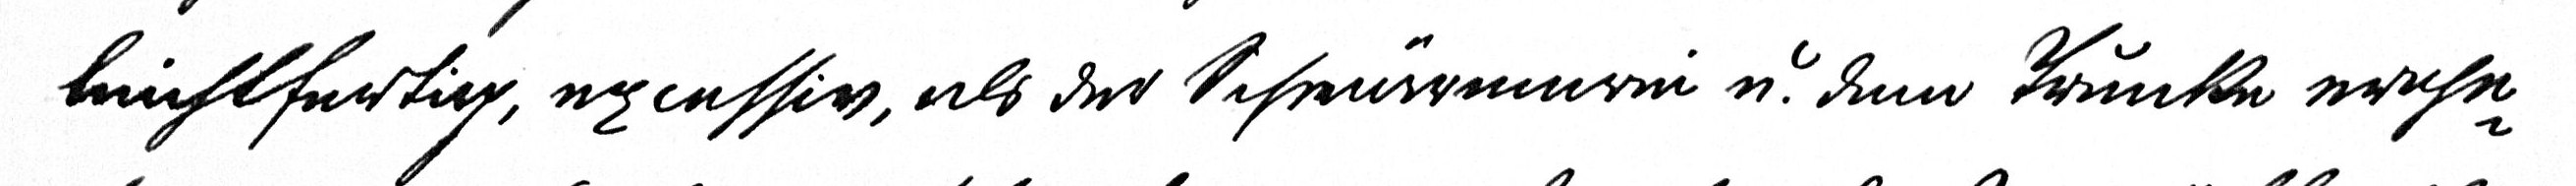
leichtfertig, excessir, als der Schwärmerei u. dem Trunke ernse¬
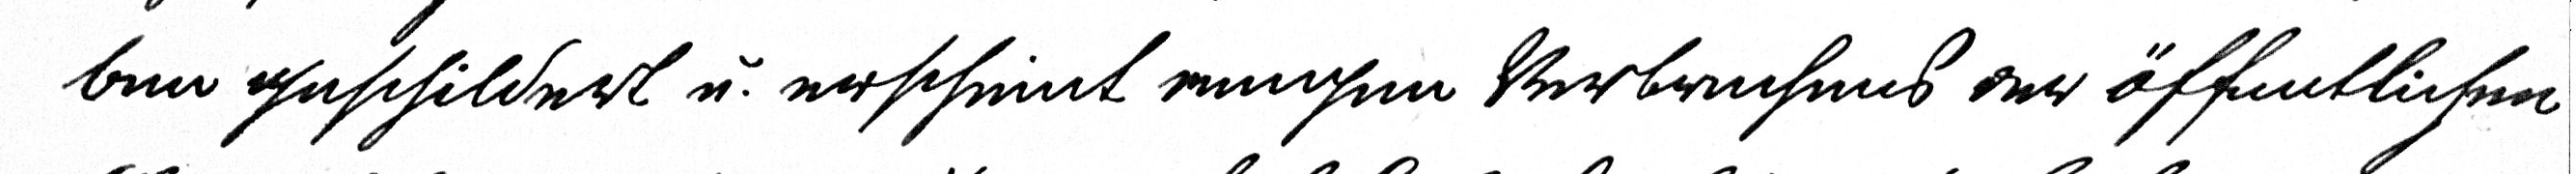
ben geschildert u. erscheint wegen Verbrechens der öffentlichen
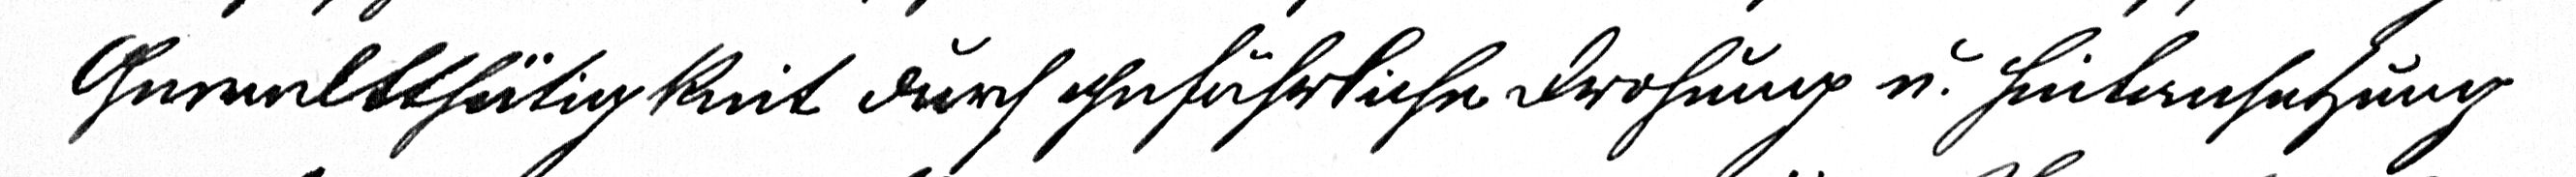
Gewaltthätigkeit durch gefährliche Drohung u. Heilansetzung
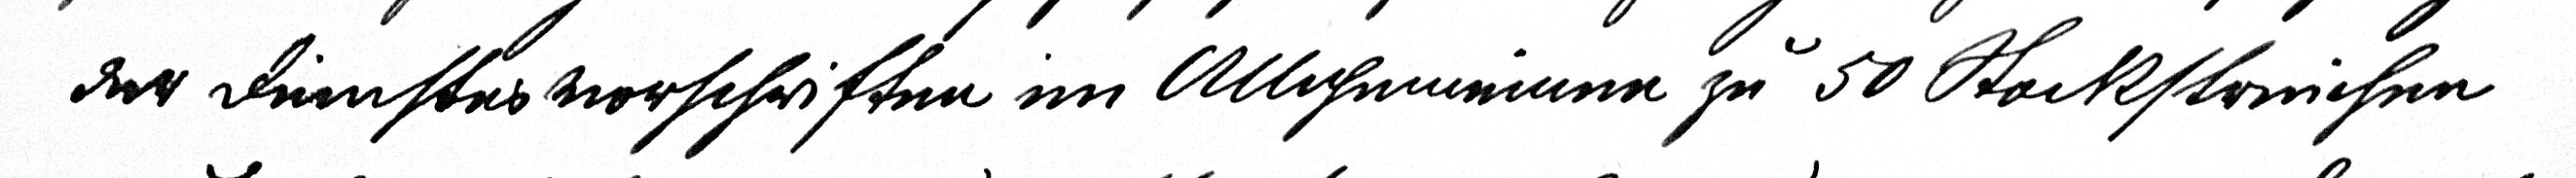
der Dienstes vorschriften im Allgemeinen zu 50 Stockstreichen
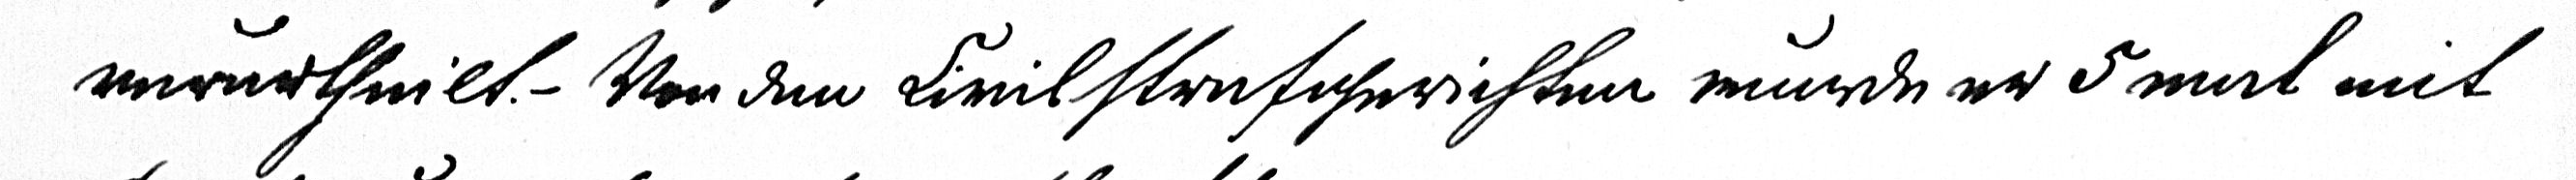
verurtheilt. - Von dem Civilstrafgerichten wurde er 5 mal mit
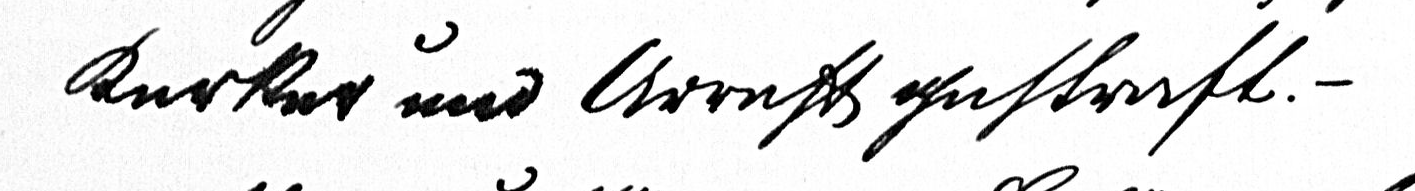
Kerker und Arrest gestraft. -
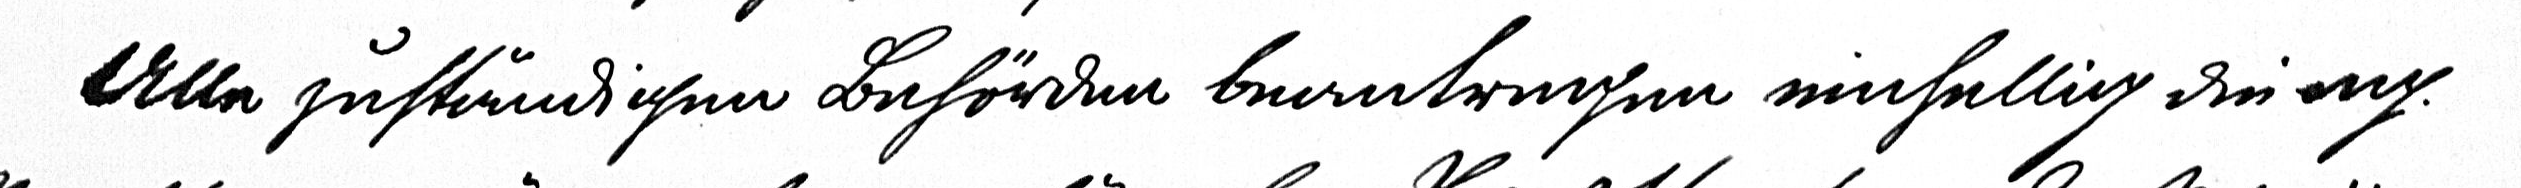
Alla zustand ihre Behörden beantragen einhellig die ag.
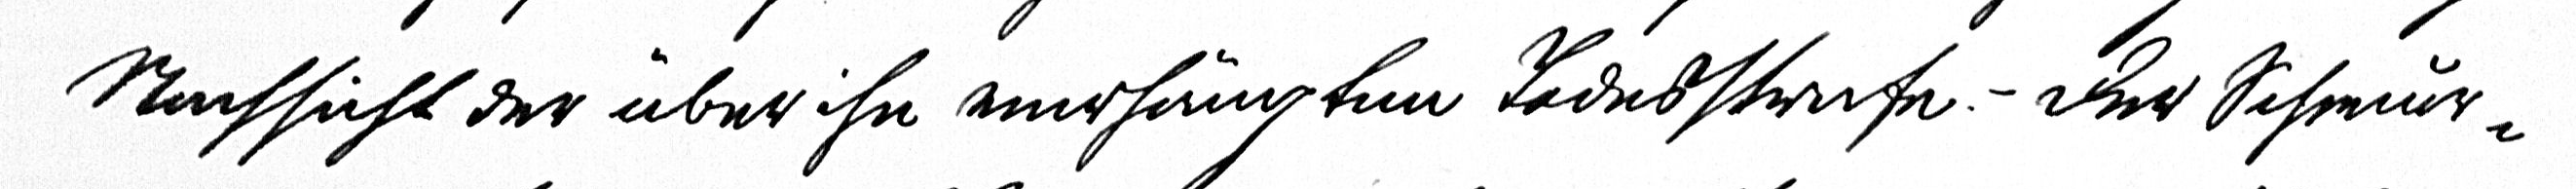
Nachsicht der über ihn verhängten Todesstrafe. - Der Schwur¬
